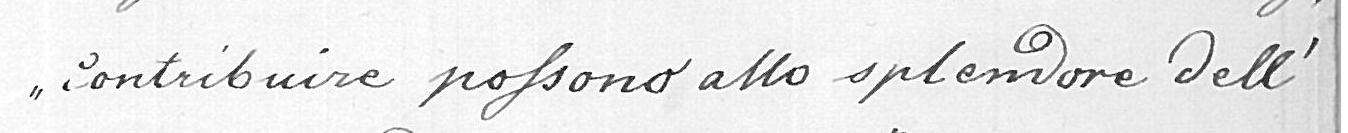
"contribuire possono allo splendore dell'
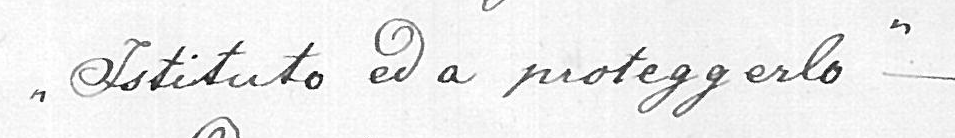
"Istituto ed a proteggerlo"
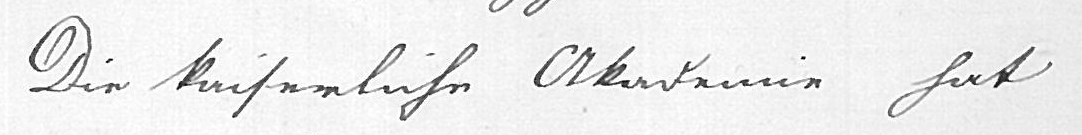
Die kaiserliche Akademie hat
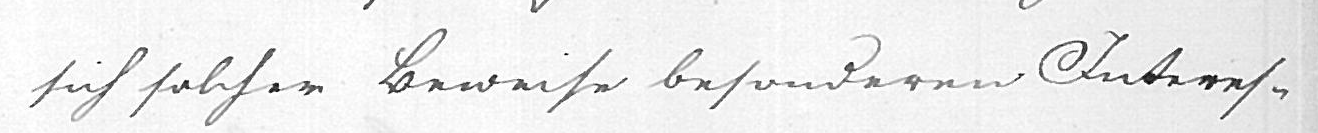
sich solcher Beweise besonderen Interes-
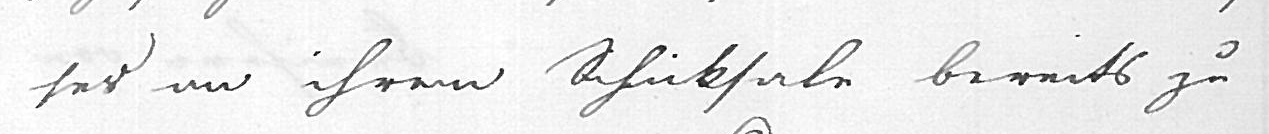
ses an ihrem Schicksale bereits zu
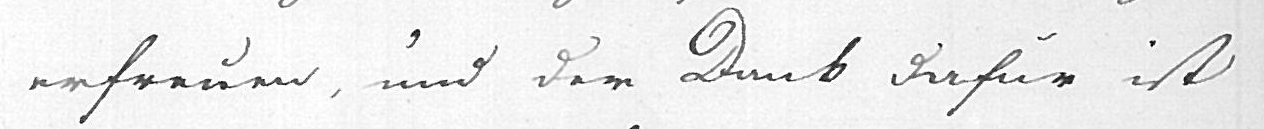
erfreuen, und der Dank dafür ist
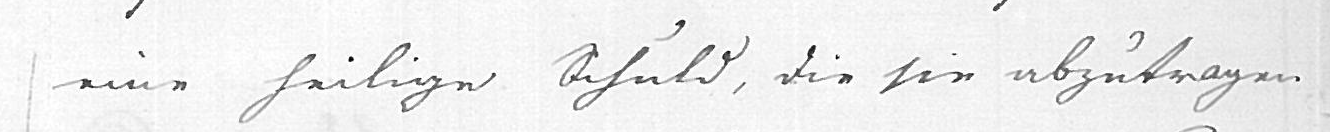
eine heilige Schul, die sie abzutragen
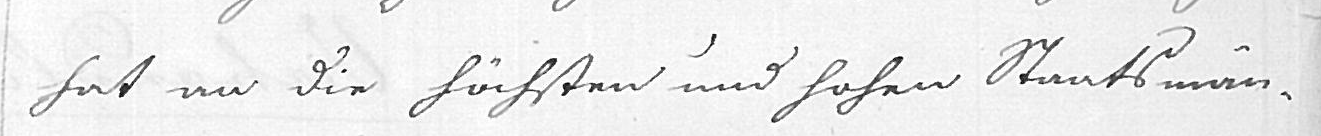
hat an die höchsten und hohen Staatsmän-
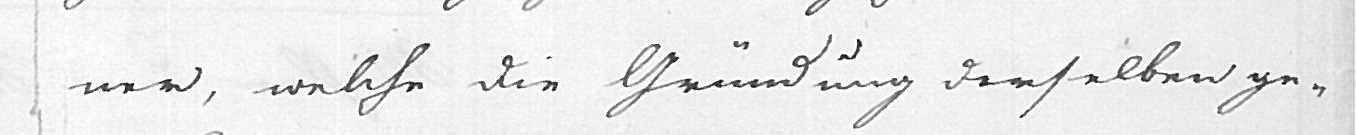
ner, welche die Gründung derselben ge-
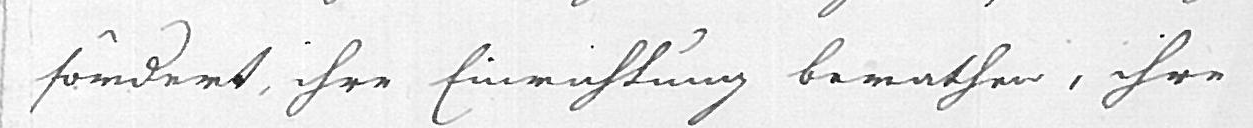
fördert, ihre Einrichtung berathen, ihre
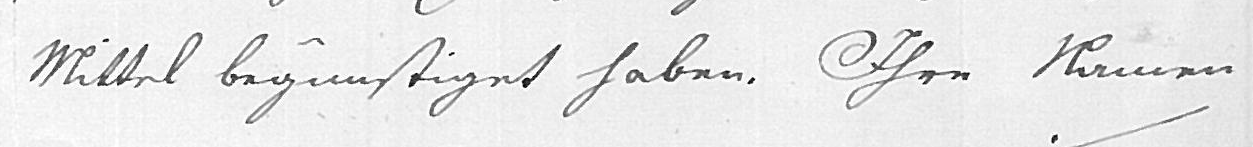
Mittel begünstiget haben. Ihre Namen
